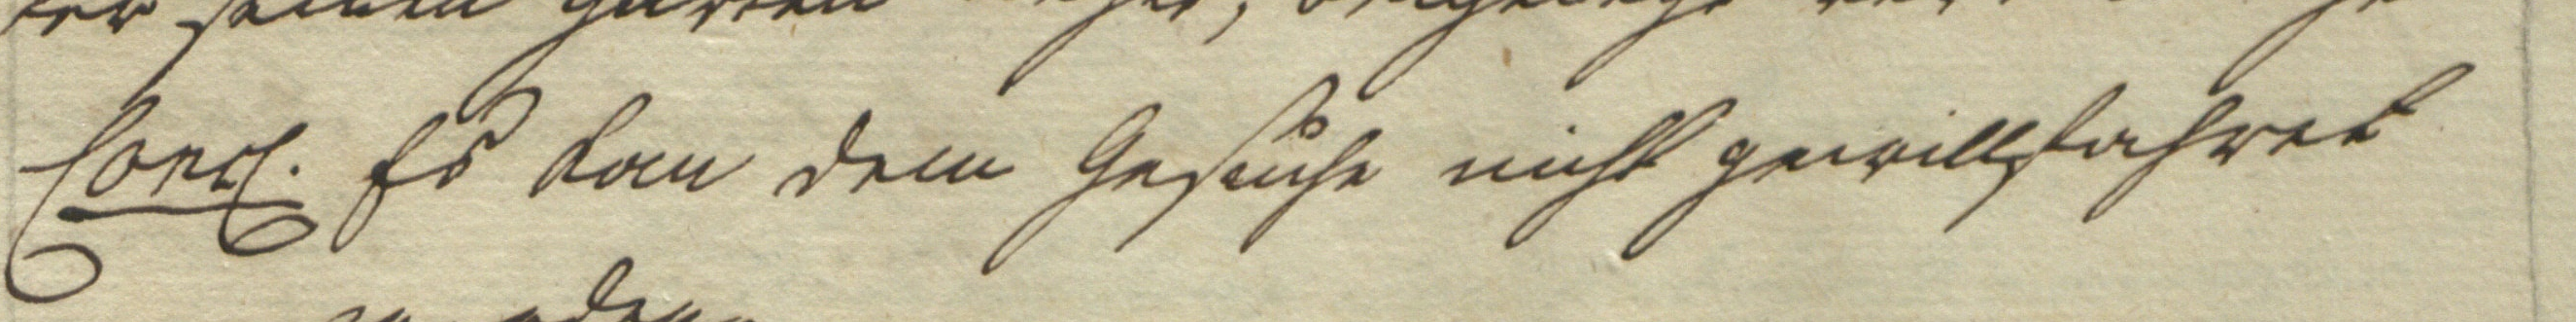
Concl. Es kan dem Gesuche nicht gewillfahret
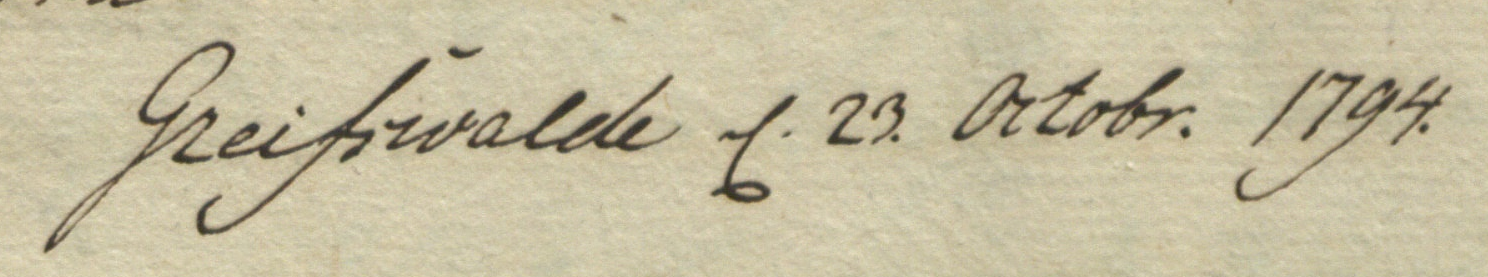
Greifswalde d. 23. Octobr. 1794.
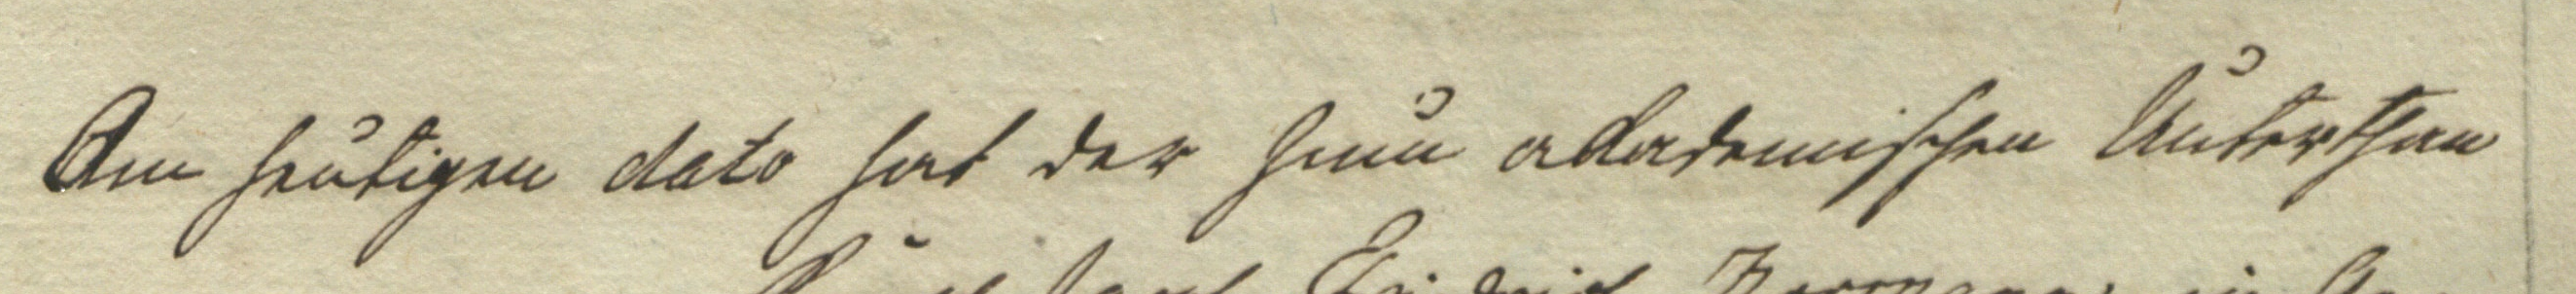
Am heutigen dato hat der zum akademischen Unterthan
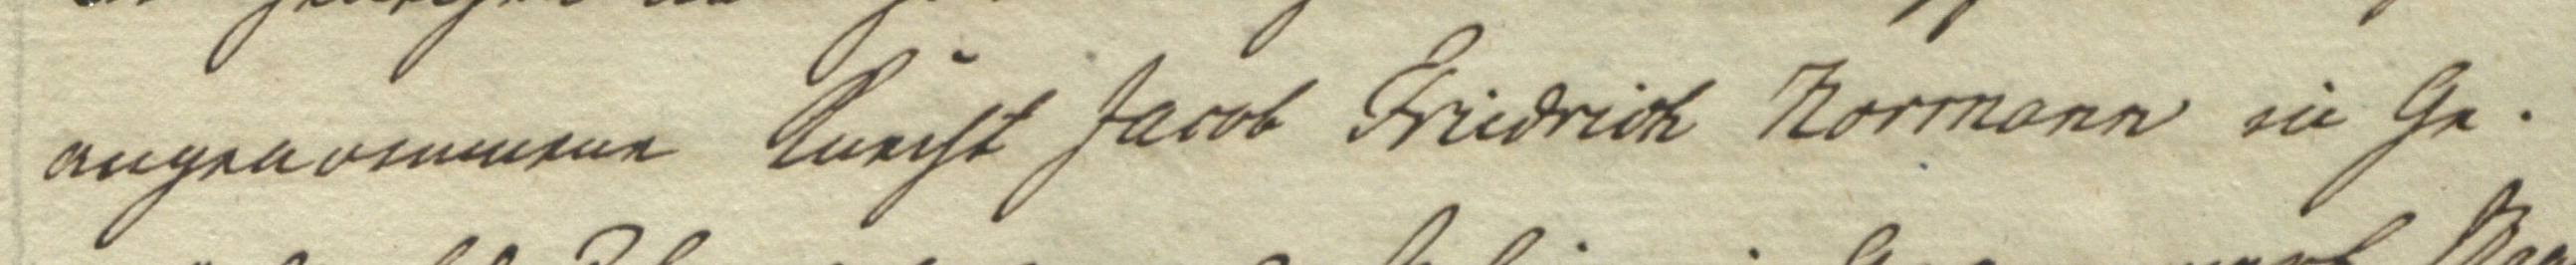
angenommene Knecht Jacob Friedrich Normann in Ge¬
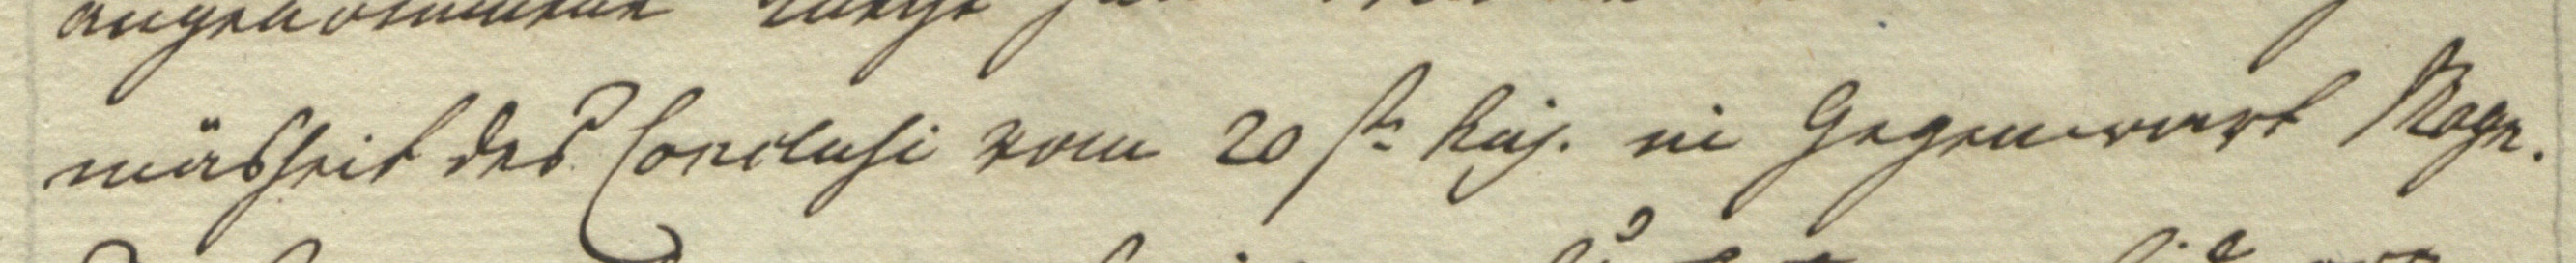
mäsheit des Conclusi vom 20 st. huj. in Gegenwart Magn.
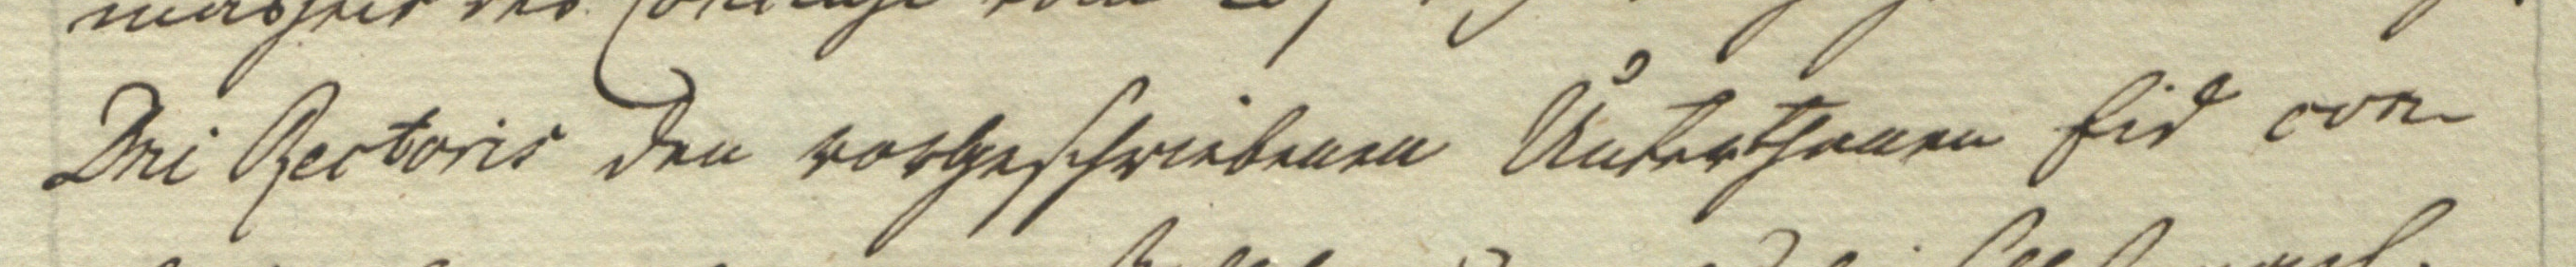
Dni Rectoris den vorgeschriebenen Unterthanen Eid con¬
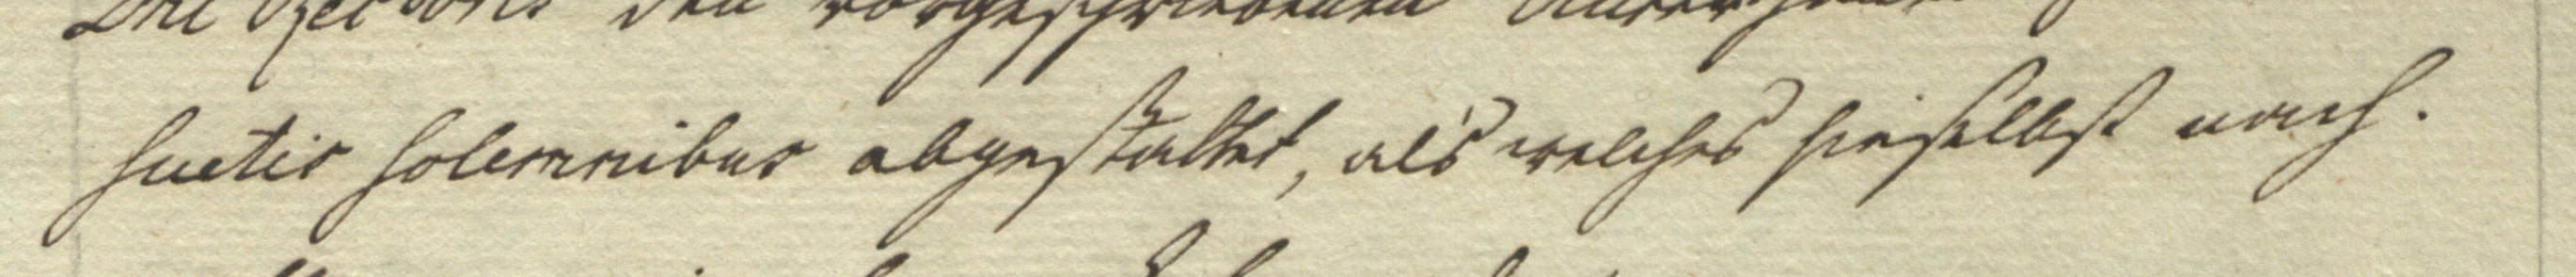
suetis solemnibus abgestattet, als welches hieselbst nach¬
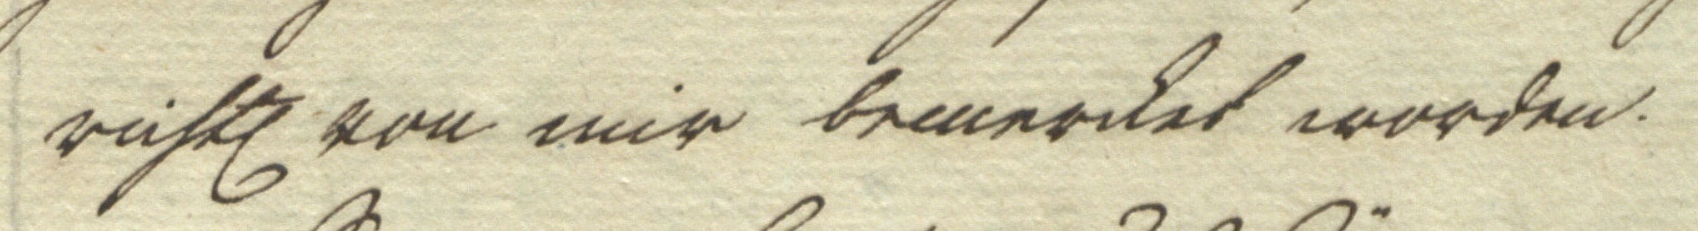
richtl. von mir bemercket worden.
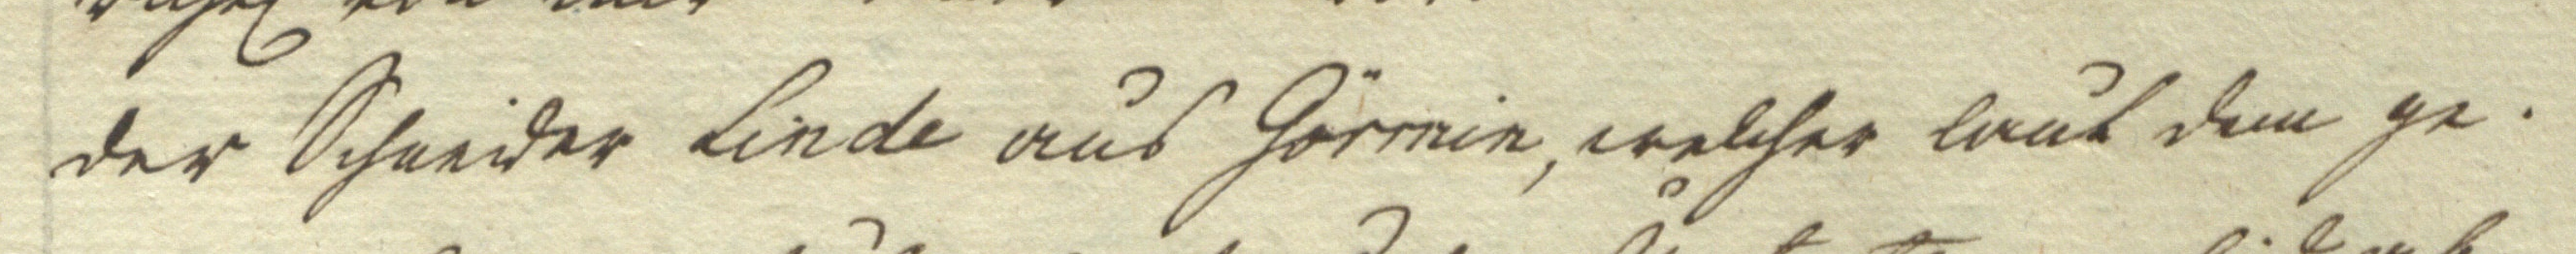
Der Schneider Linde aus Görmin, welcher laut dem ge¬
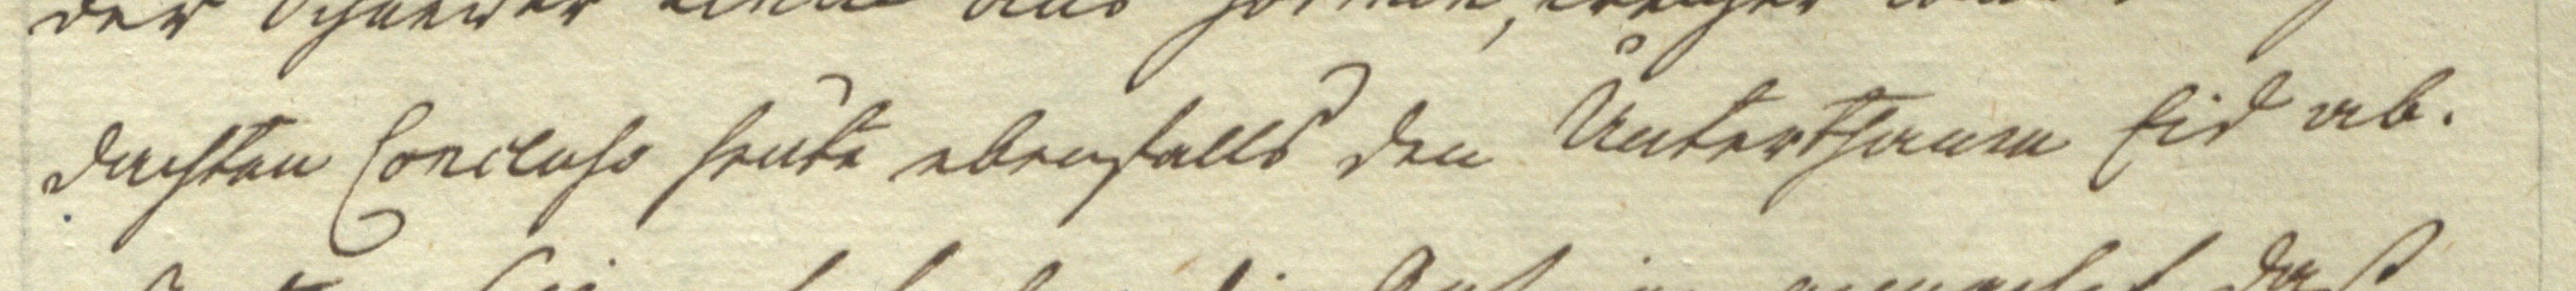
dachten Concluso heute ebenfalls den Unterthanen Eid ab¬
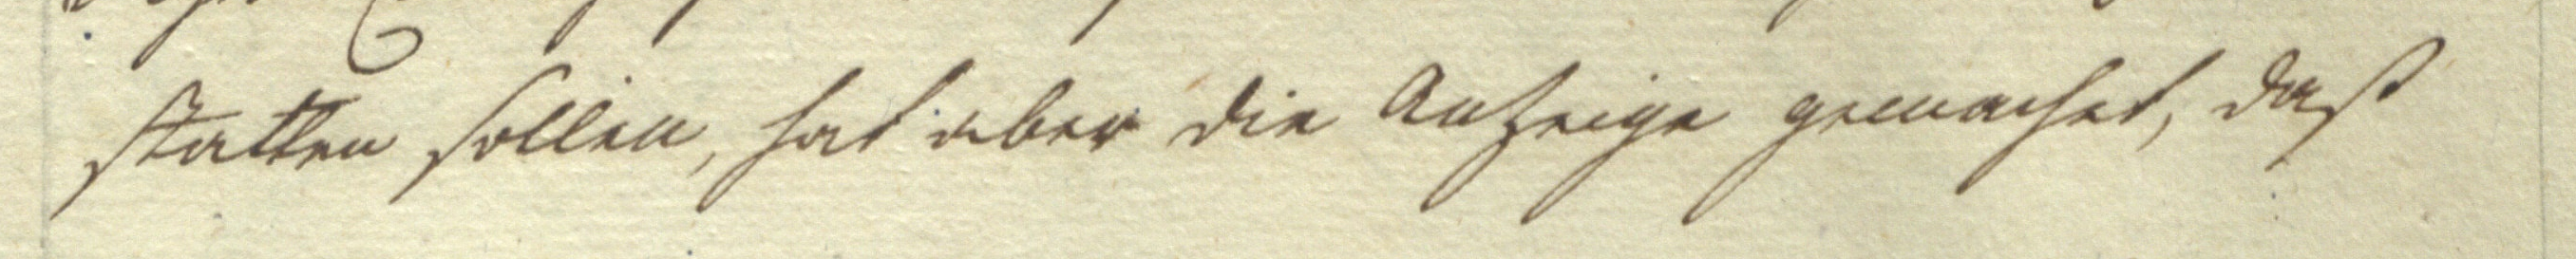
statten sollen, hat aber die Anzeige gemachet, daß
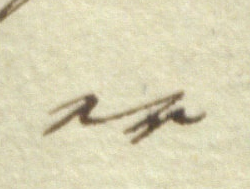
er
